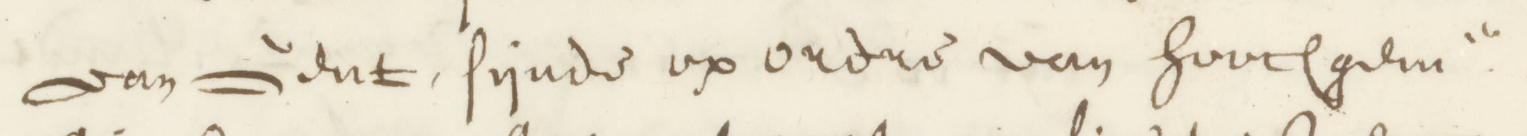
van Gent, sijnde op ordre van hoochgeme
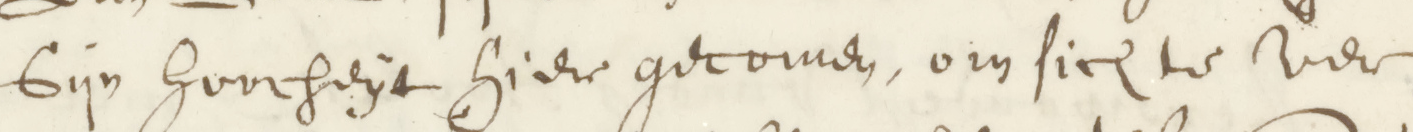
Sijn hoocheijt hier gecomen, om sich te ver„
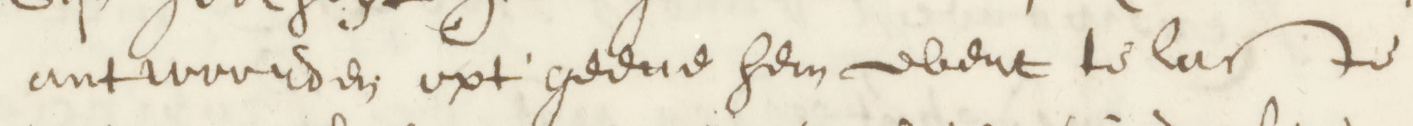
antwoorden opt' geene hem wert te laste
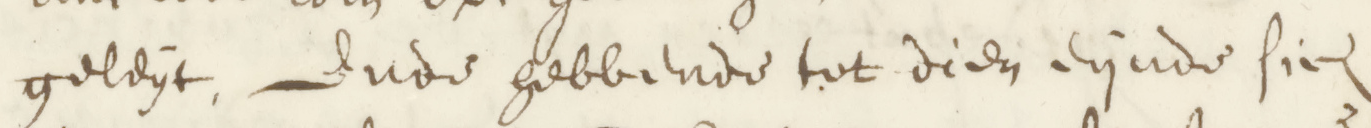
geleijt, Ende hebbende tot dien eijnde sich
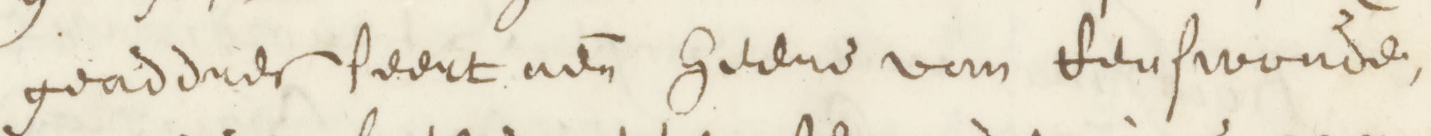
geaddresseert aen heere van Renswoude,
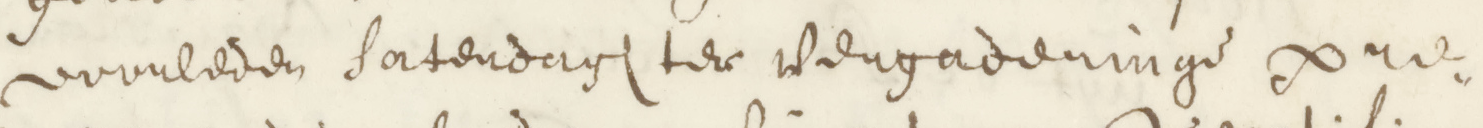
voorleden Saterdagh ter Vergaderinge pre„
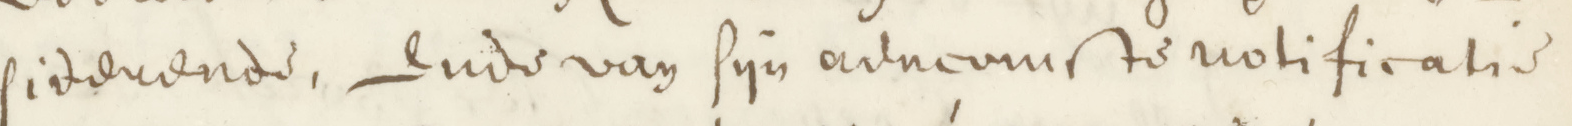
siderende, Ende van sijn aencomste notificatie
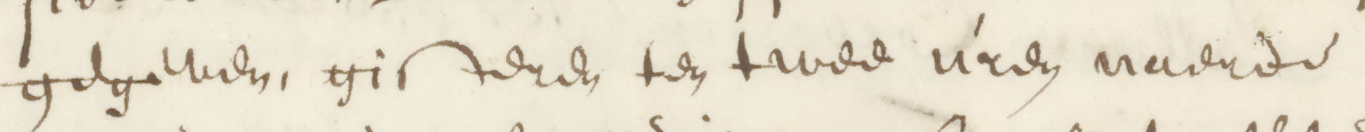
gegeven, gisteren ten twee uren naerde
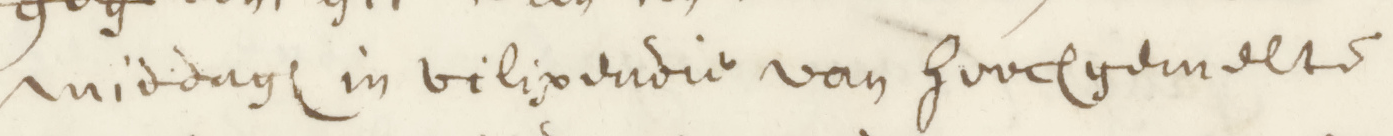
middagh in vilipendie van hoochgemelte
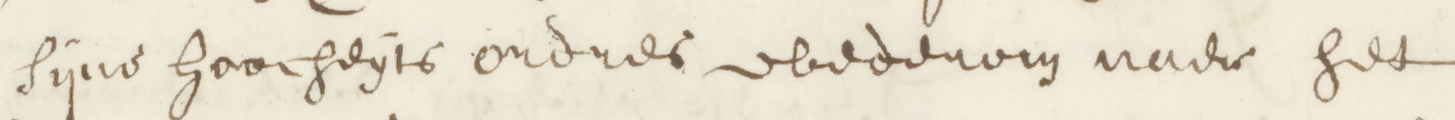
Sijne hoocheijts ordres wederom naer het
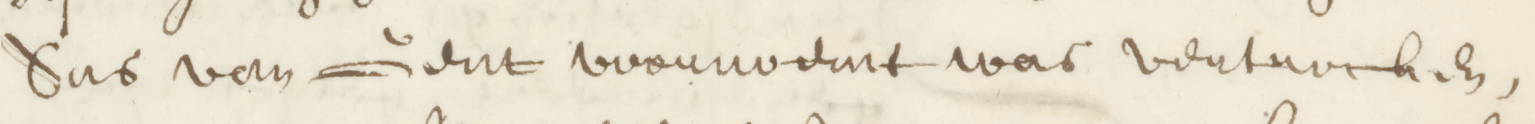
Sas van Gent voornoemt was vertrocken,
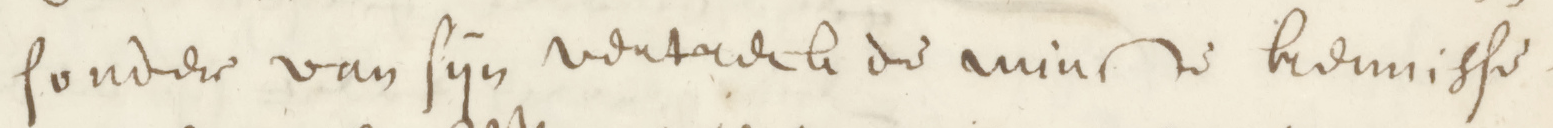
sonder van sijn vertreck de minste kennisse
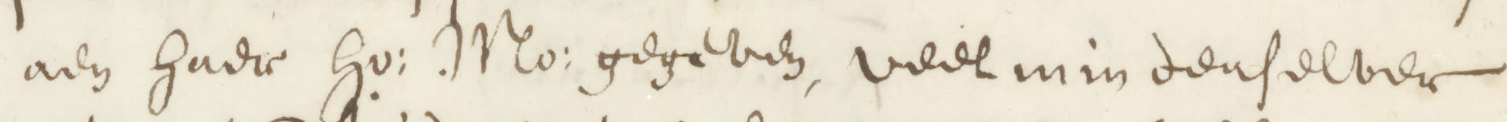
aen haer Ho:Mo: gegeven, veel min derselver
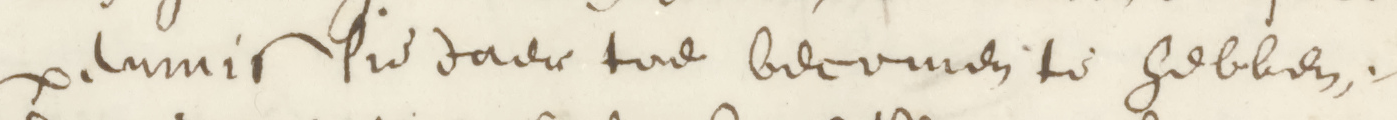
permissie daer toe becomen te hebben;
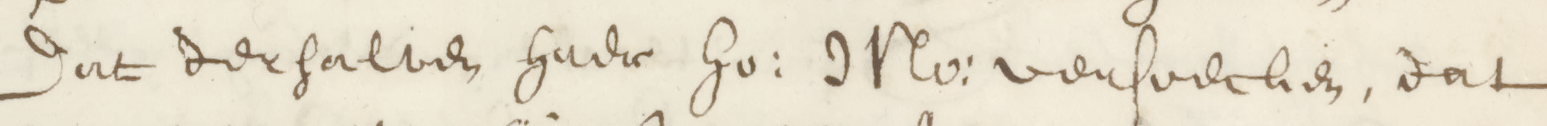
dat derhalven haer Ho:Mo: versoecken, dat
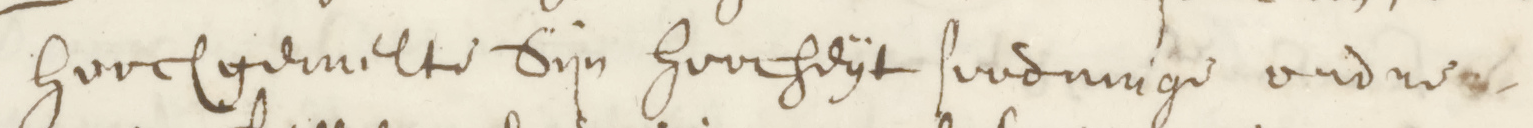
hoochgemelte Sijn hoocheijt soodanige ordre
